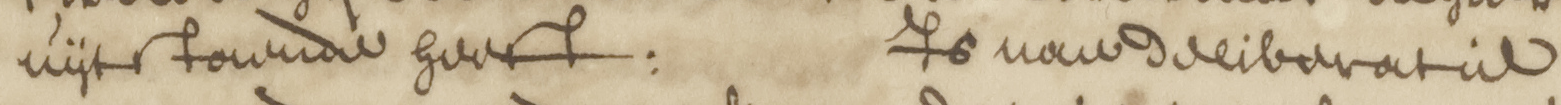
uijtstaende heeft: Is nae deliberatie
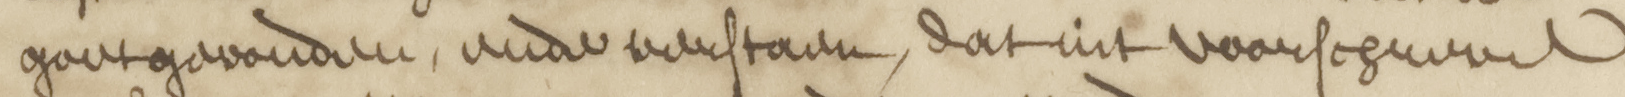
goetgevonden, ende verstaen, dat int voorschreve
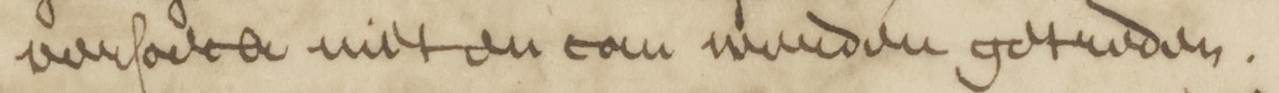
versoeck niet en can werden getreden.
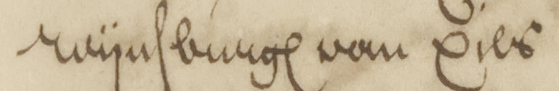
reijnsburgh van Gils
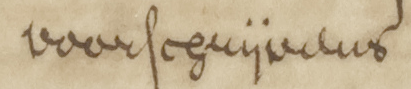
voorschrijvens
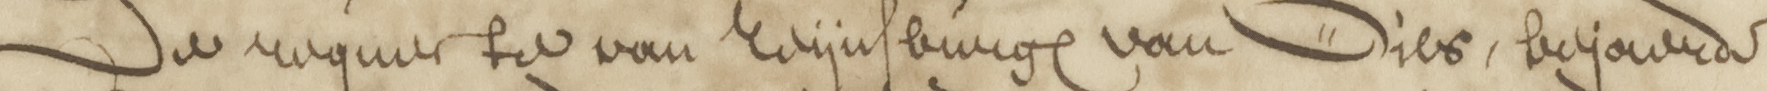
De requeste van Reijnsburgh van Gils, bejaerde
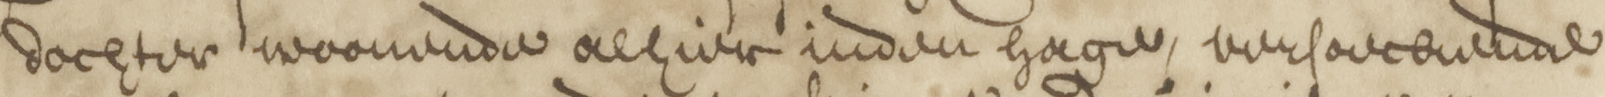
dochter woonende alhier inden hage, versoeckende
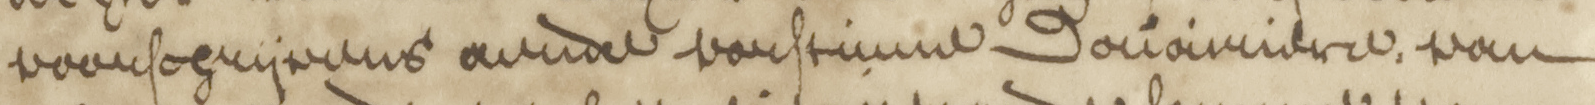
voorschrijvens aende vorstinne Douairiere van
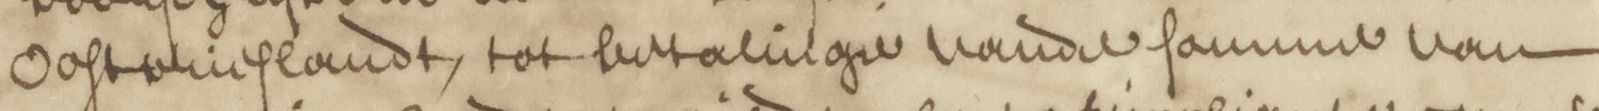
Oostvrieslandt, tot betalinge vande somme van
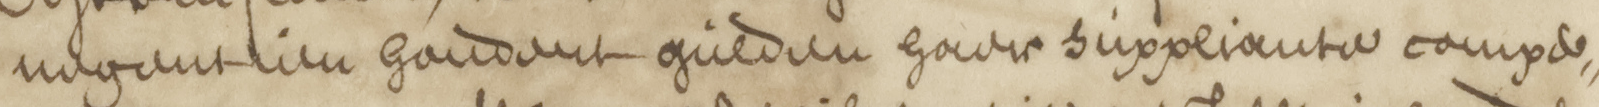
negentien hondert gulden haer suppliante compe„
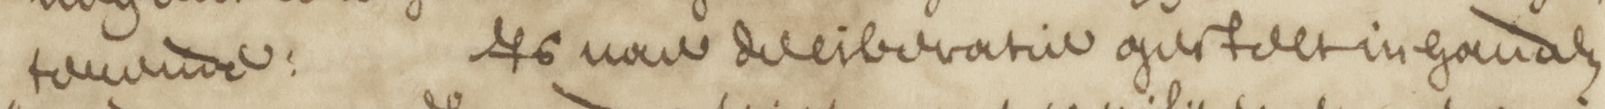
„terende: Is nae deliberatie gestelt in handen
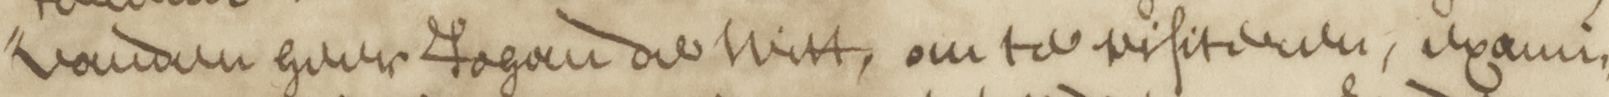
vanden heer Johan de Witt, om te visiteren, exami„
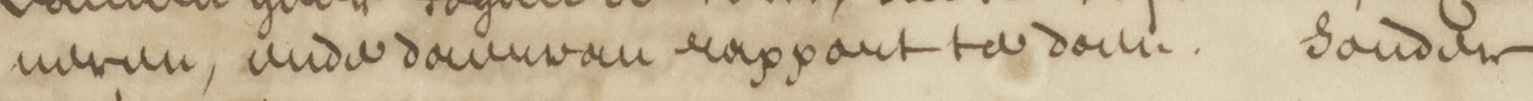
„neren, ende daervan rapport te doen. sonder
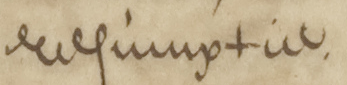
resumptie.
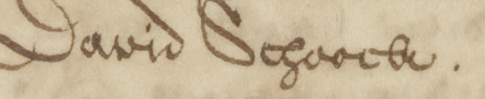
David Schoock.
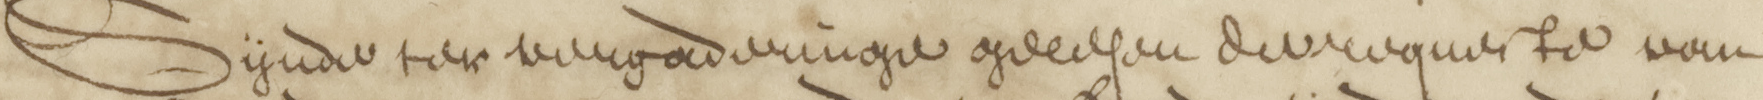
Sijnde ter vergaderinge gelesen de requeste van
